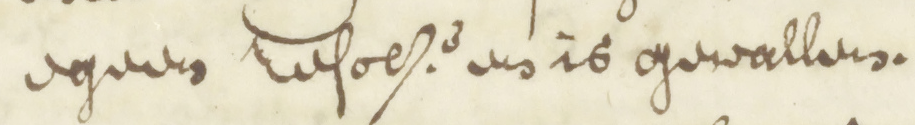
egeen resol.e en is gevallen.
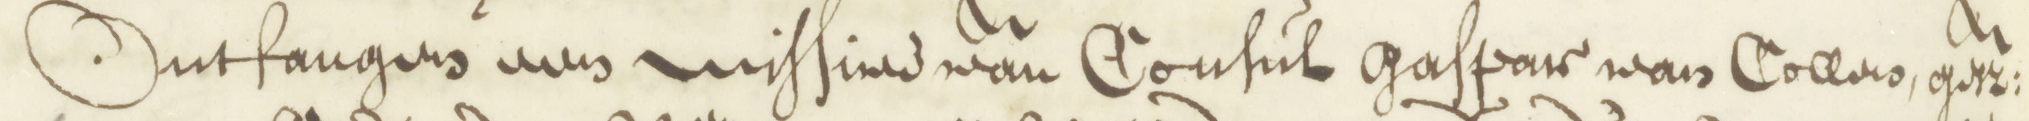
Ontfangen een missive van Consul Gaspar van Collen, gesr:
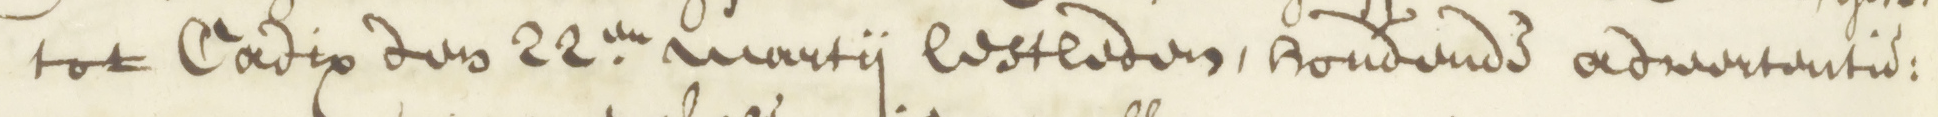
tot Cadix den 22en martij lestleden, houdende advertentie,
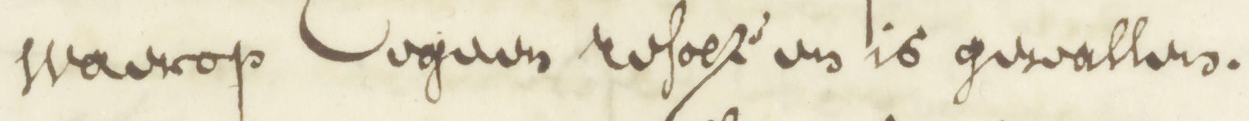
waerop egeen resolutie en is gevallen.
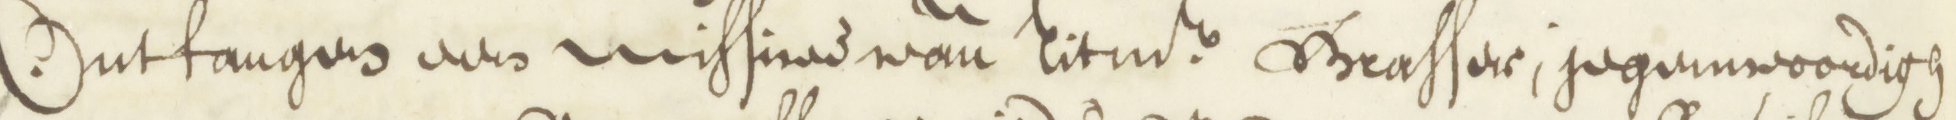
Ontfangen een missive van ritmr. Brasser, jegenwoordigh
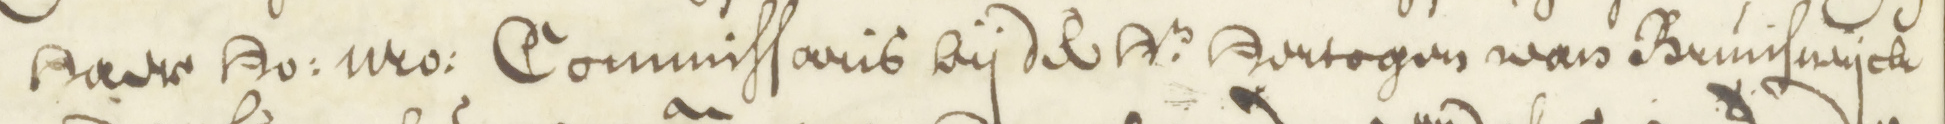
haere Ho:Mo: Commissaris bij H.n Hertogen van Brunswijck
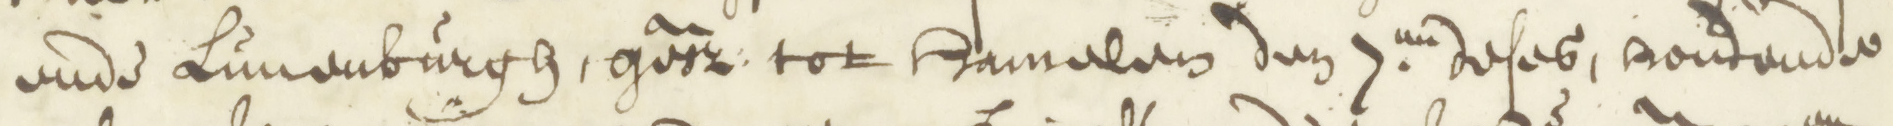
ende Lunenburgh, gesr: tot Hamelen den 7en deses, houdende
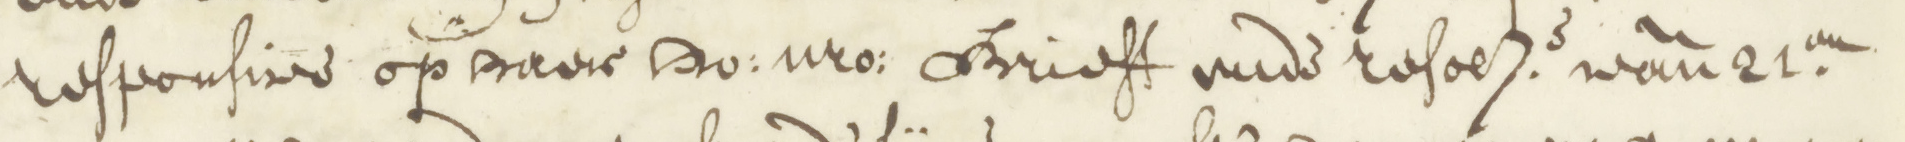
responsive op haer Ho:Mo: Brieff ende resol.e van den 21en
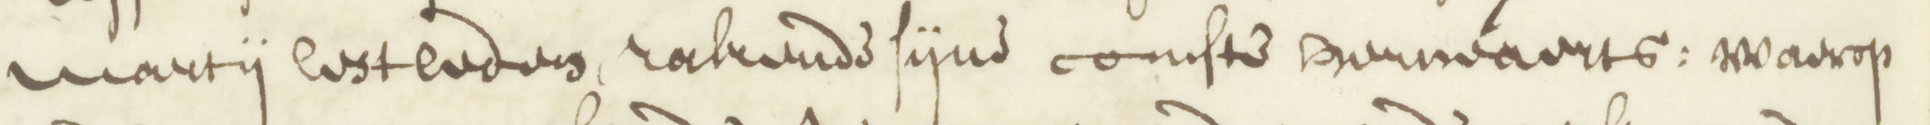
martij lestleden, rakende sijne comste herwaerts. Waerop
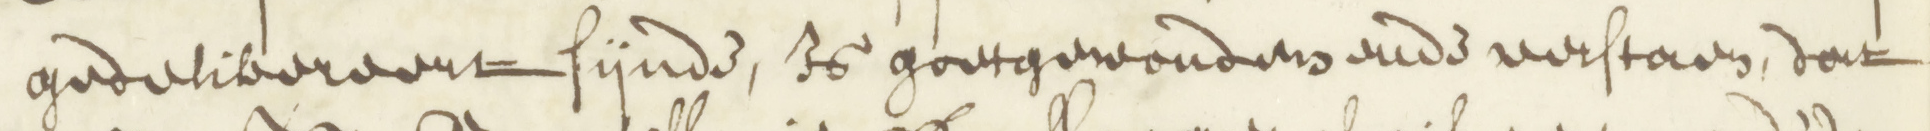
gedelibereert sijnde, Is goetgevonden ende verstaen dat
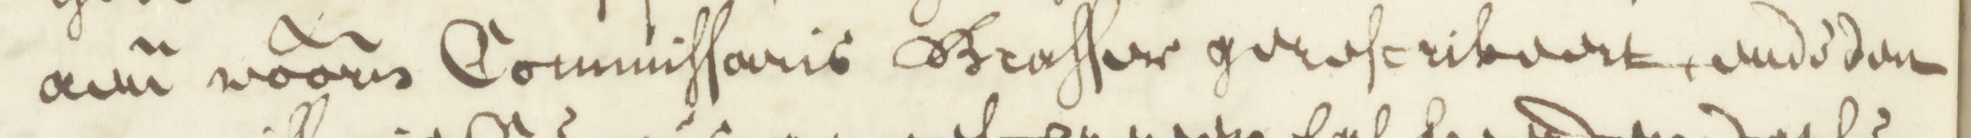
aen den voorn. Commissaris Brasser gerescribeert, ende den
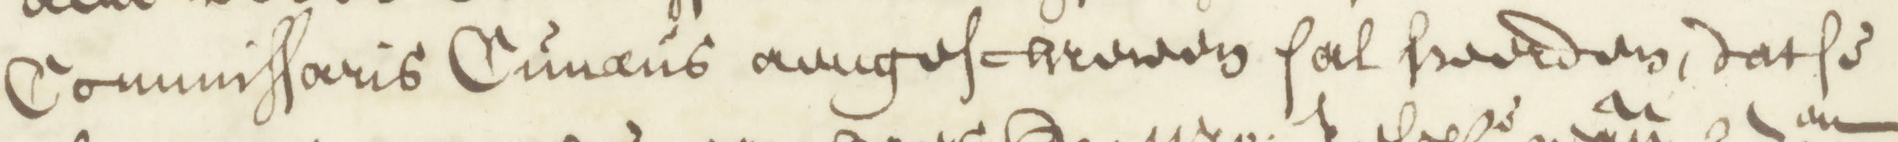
Commissaris Cunaus aengeschreven sal werden dat se
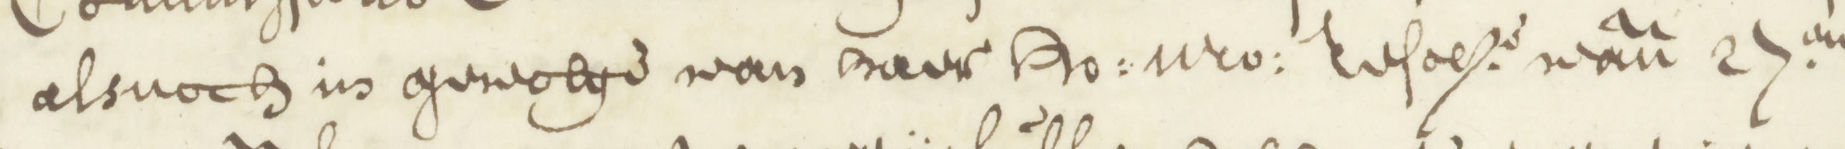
alsnoch in gevolge van haer Ho:Mo: resol.e van 27en
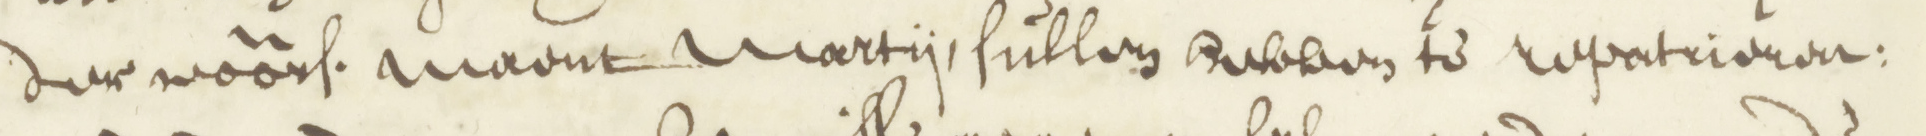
der voors. maent martij, sullen hebben te repatrieren:
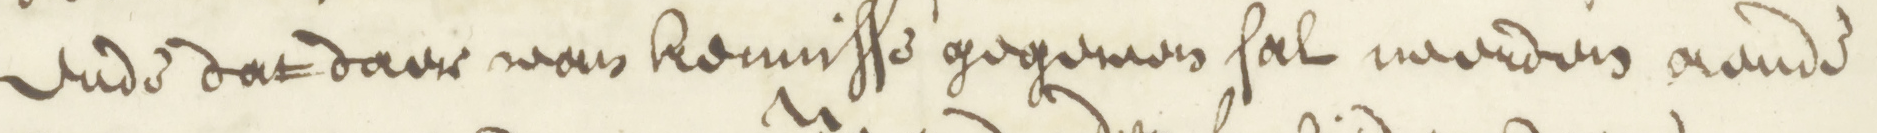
ende dat daer van kennisse gegeven sal worden aende
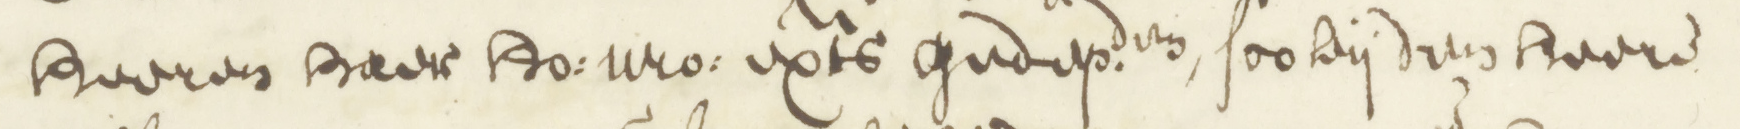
heeren haer Ho:Mo: exts gedep.den soo bij den heere —
